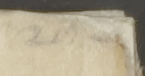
28
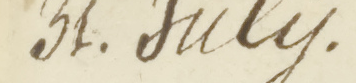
31. Julij.
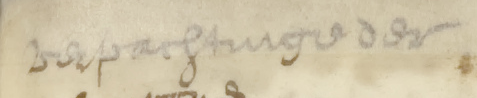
verpachtinge der
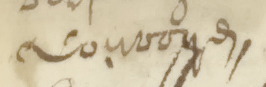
Convoyen.
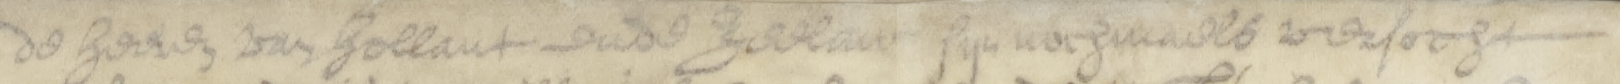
de heeren van hollant ende Zeelant syn nochmaels versocht
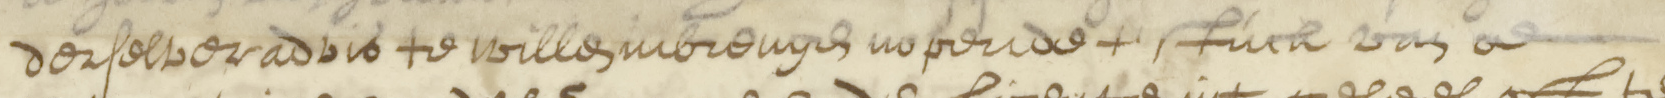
derselver advis te willen inbrengen nopende t‛stuck van de
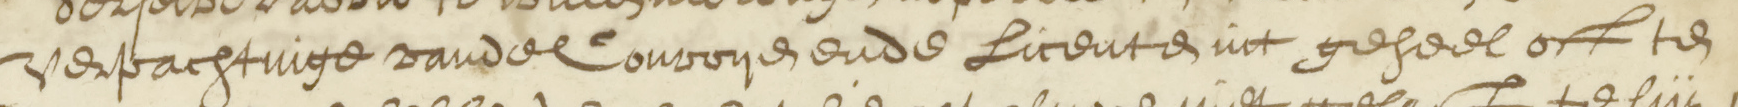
verpachtinge vande Convoyen ende Licenten int geheel off ten
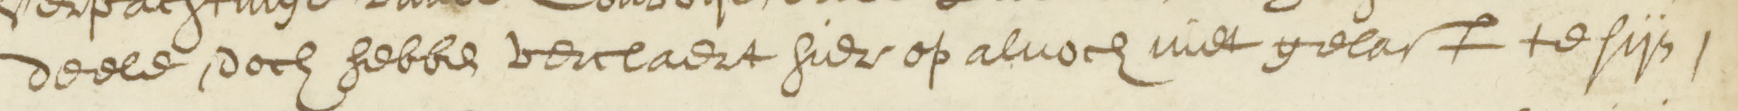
deele, doch hebben verclaert hier op alnoch niet gelast te sijn.
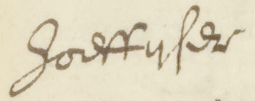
Hoeffyser
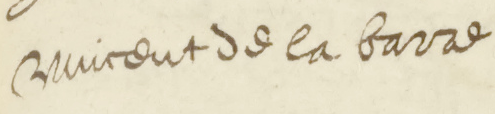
Vincent de la barre
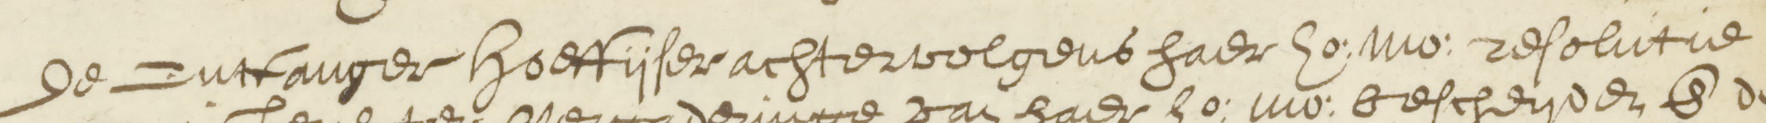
De Ontfanger Hoeffijser achtervolgens haer ho:Mo: resolutie
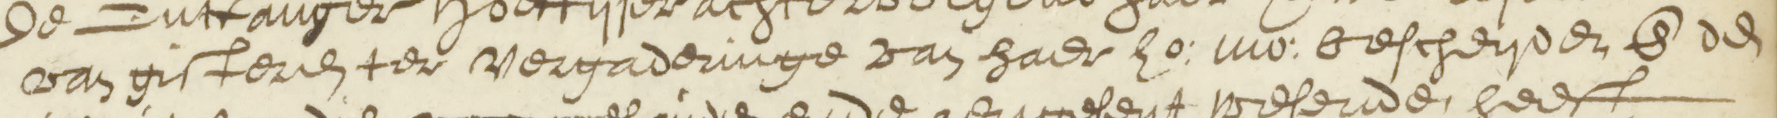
van gisteren ter vergaderinge van haer ho:mo: bescheyden & den
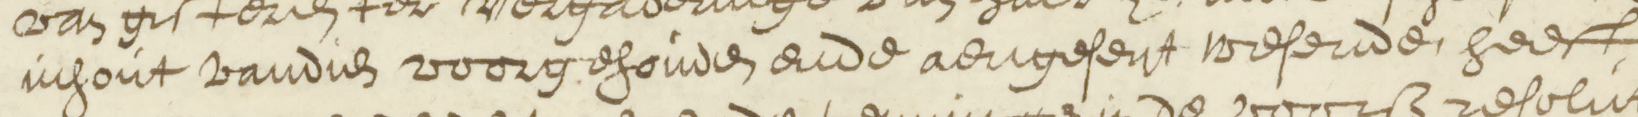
inhout vandien voorgehouden ende aengeseyt wesende, heeft
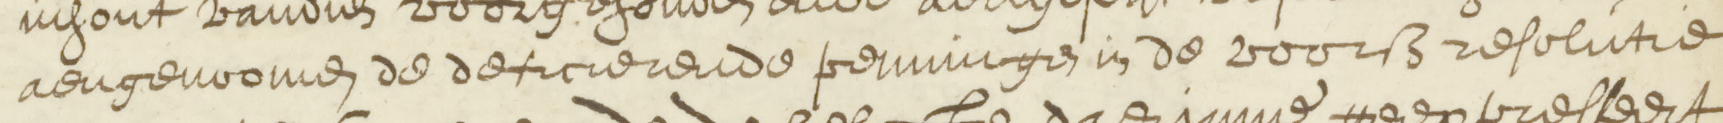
aengenoomen de deficierende penningen in de voors resolutie
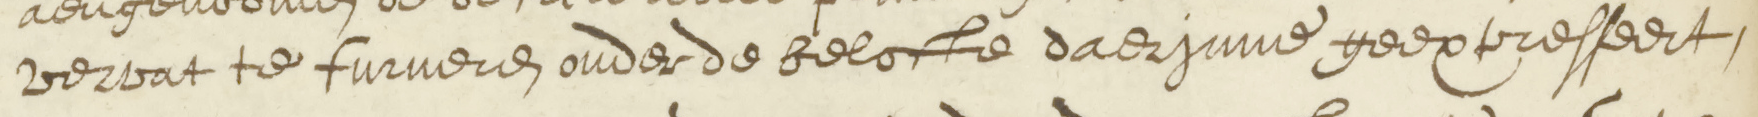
vervat te furneren onder de belofte daerinne geexpresseert.
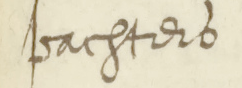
pachters
